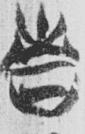青（請）
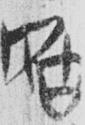姑（苦）
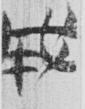○（成）
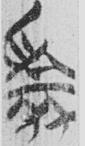○（家）
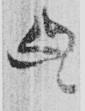父
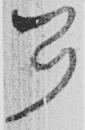乃
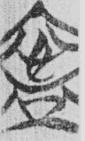○（寧）
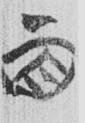百
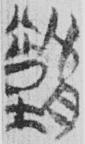○（豫）
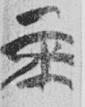不
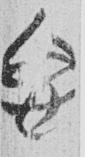思（使）
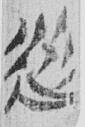從
